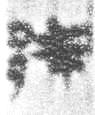邦
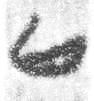㠯（以）
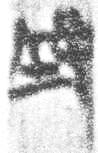城（成）
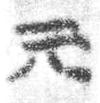亓（其）
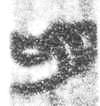名
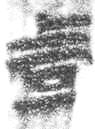者
